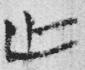亡
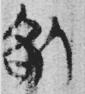咎
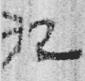九
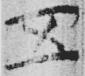五
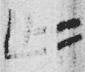亡（无）
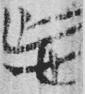忘
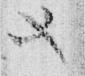又（有）
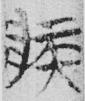疾
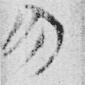勿
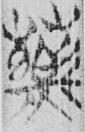藥
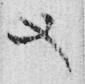又（有）
